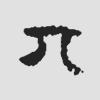甘
